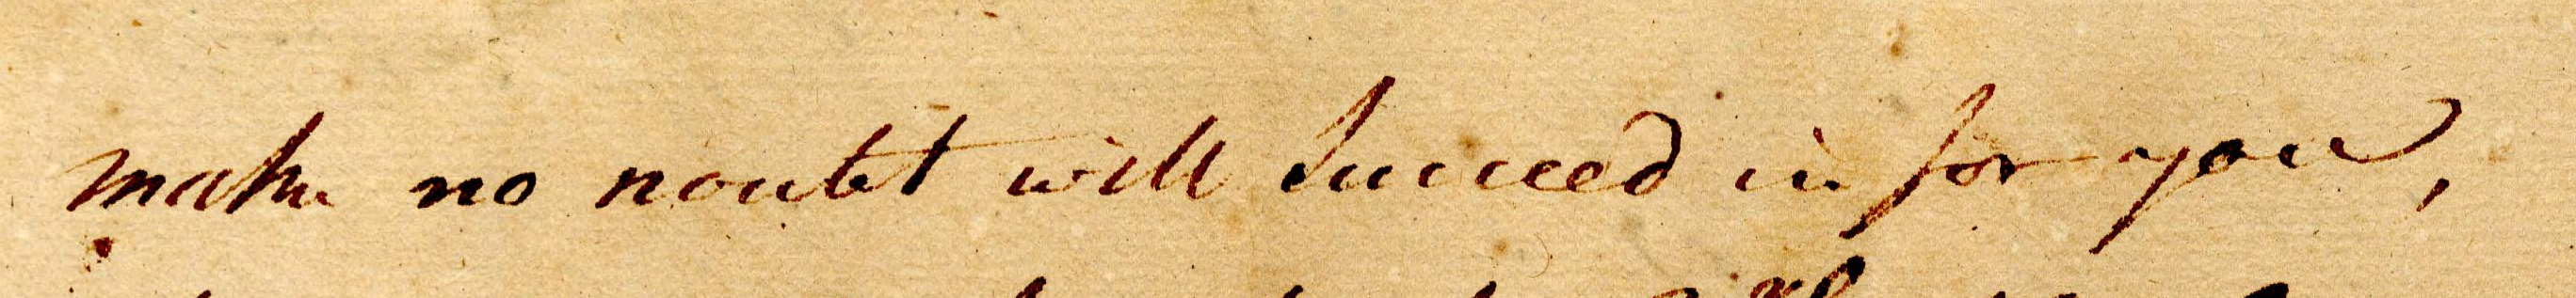make no noubt will succeed in for you,
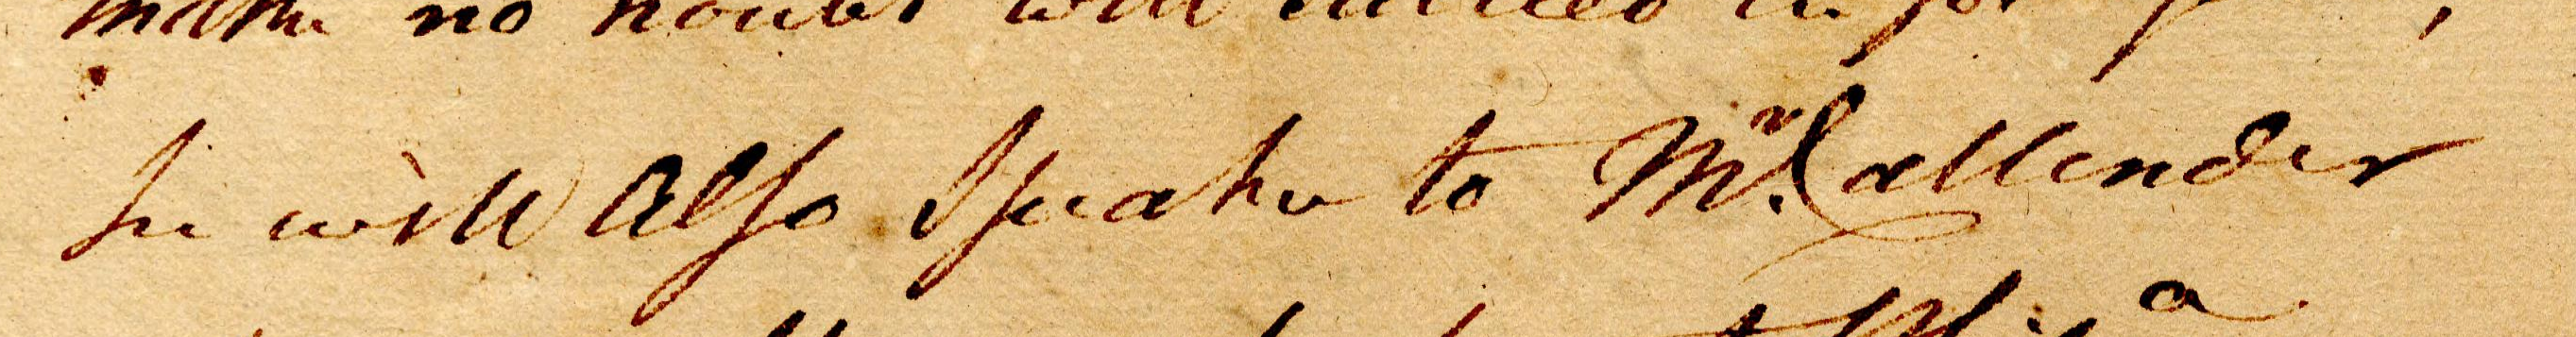he will Also Speake to M^r. Callender
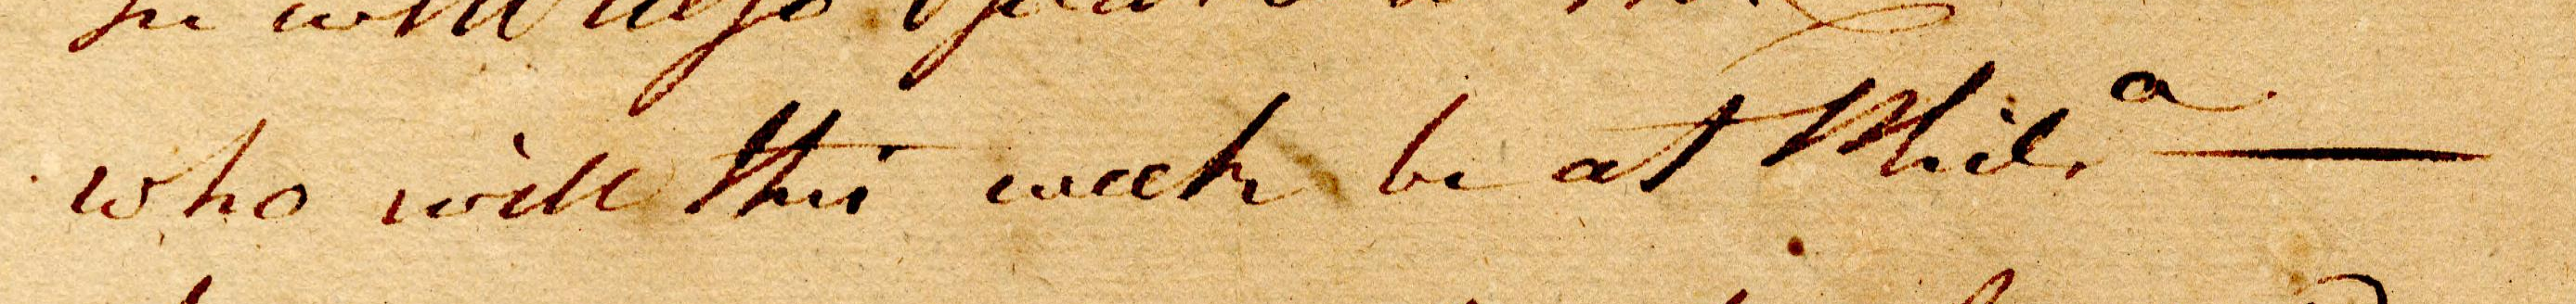who well this week be at Phil^a.-
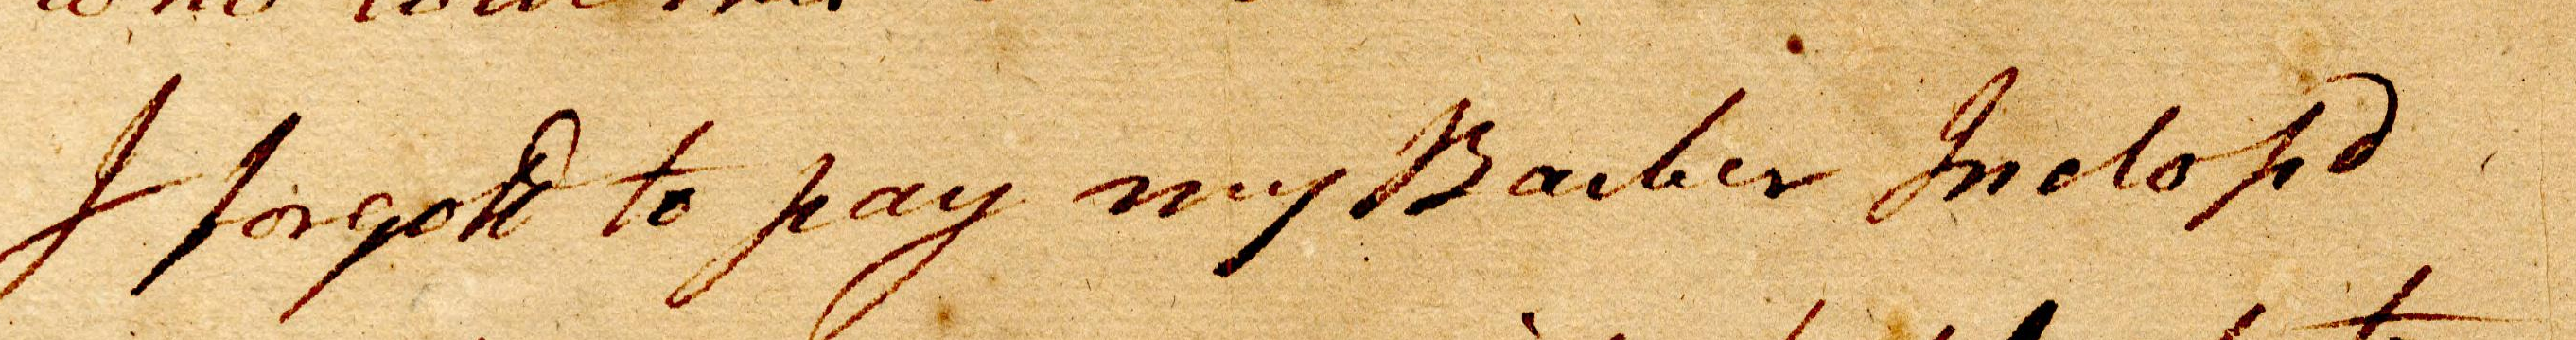& forgot to pay my barber Inclosd
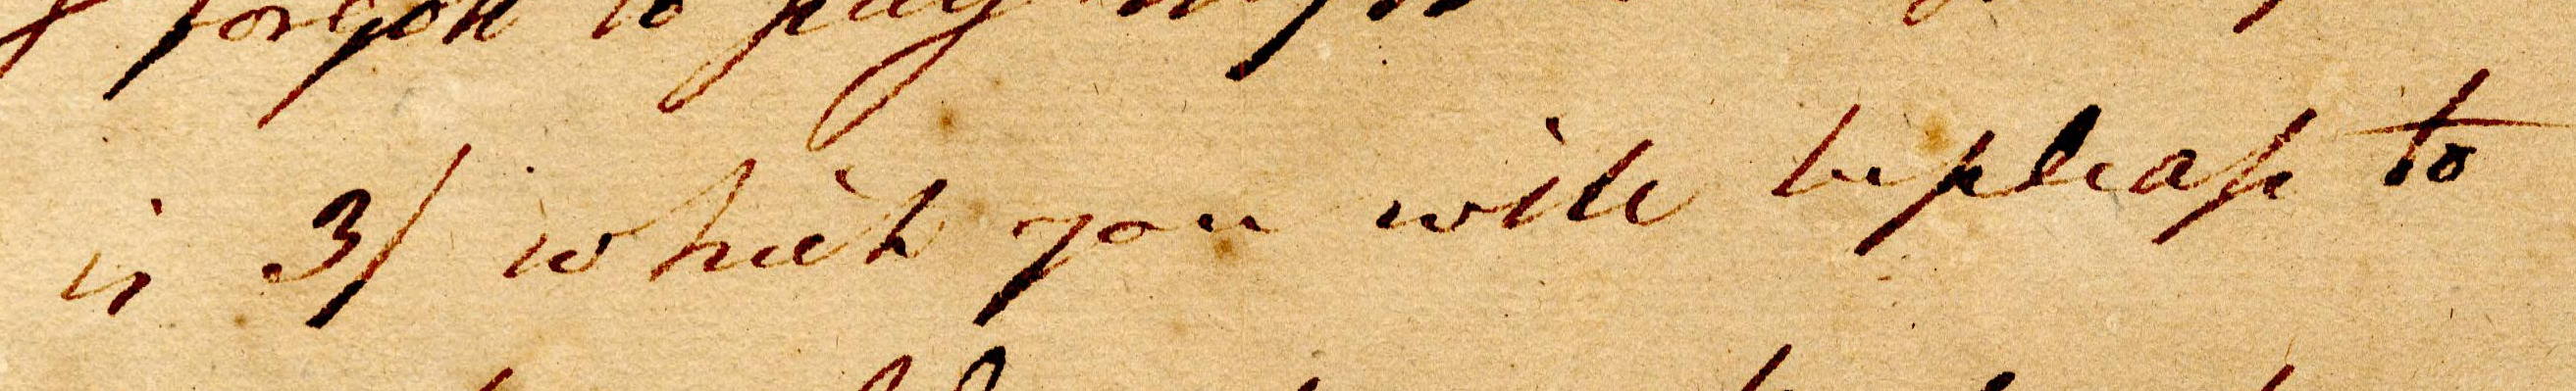is 3s which you will be please to
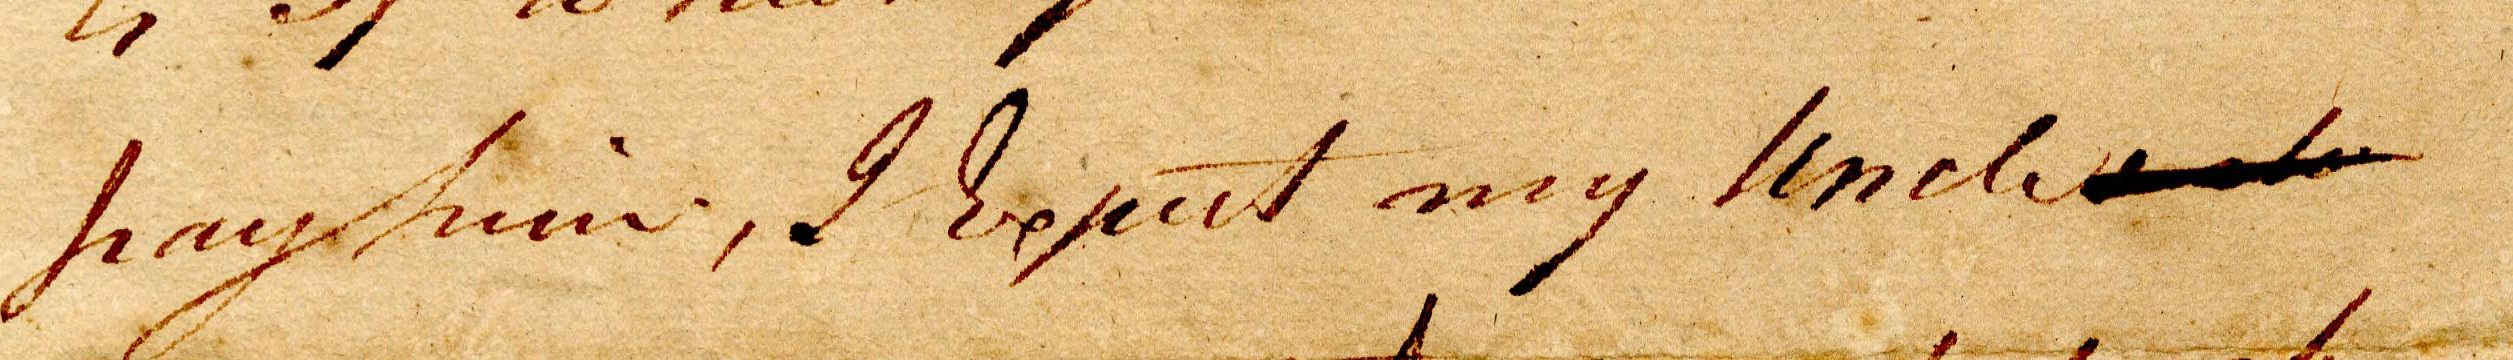pay him, I Expect my Uncle [____]
